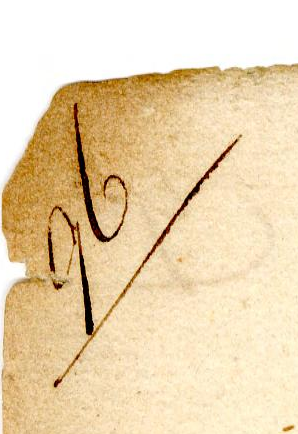96
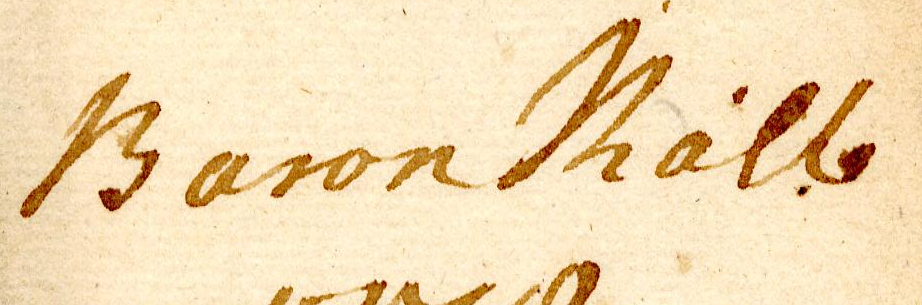Baron Kalb
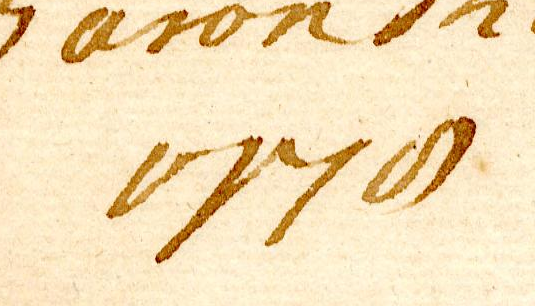1778
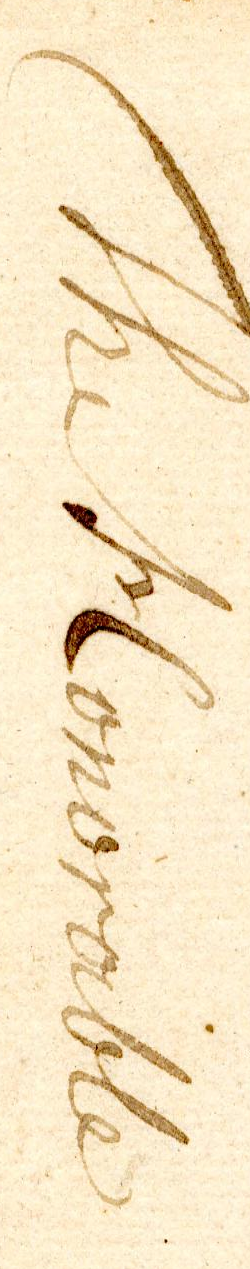The Honorable
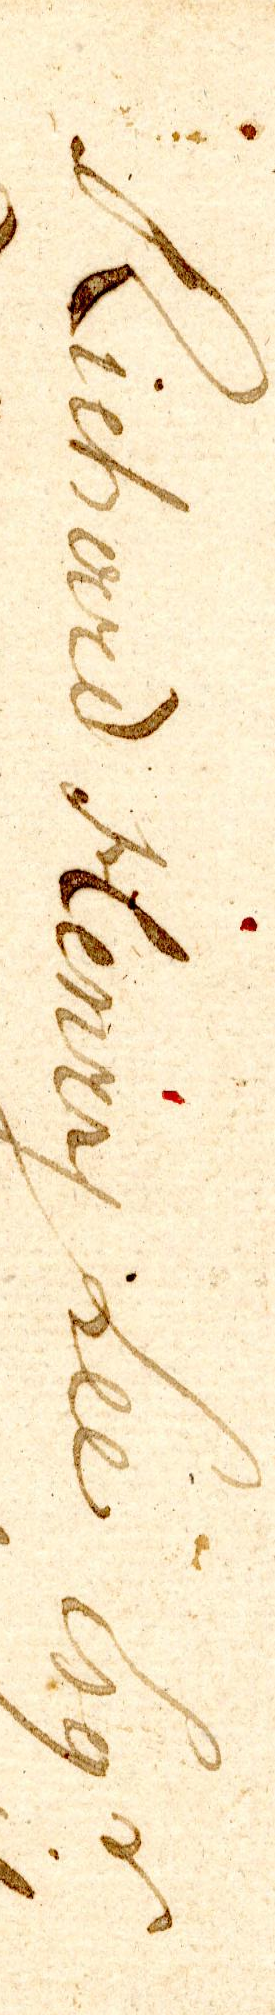Richard Henry Lee Esq^r.
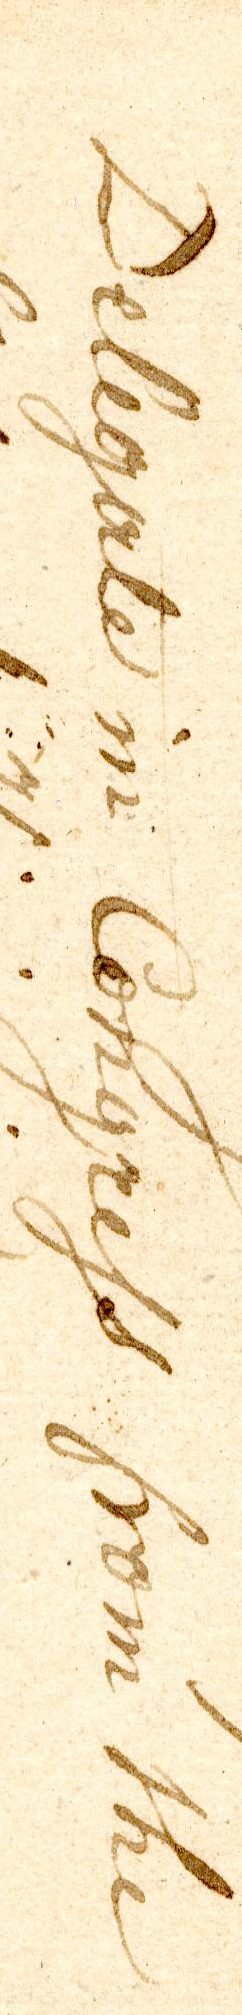Delegate in Congress from the
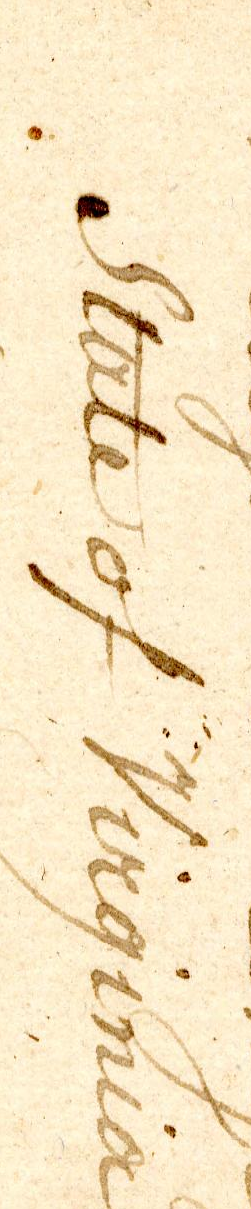State of Virginia
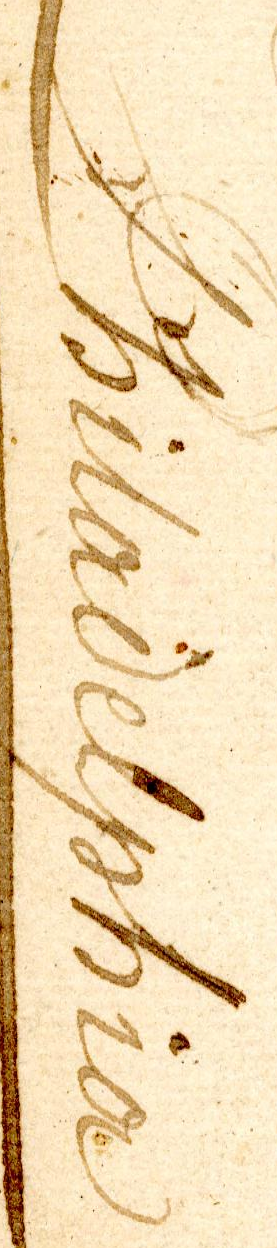Philadelphia
